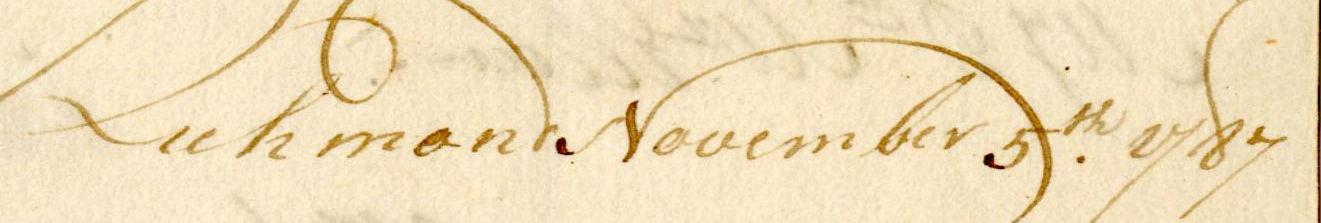Richmond November 5^th. 1787
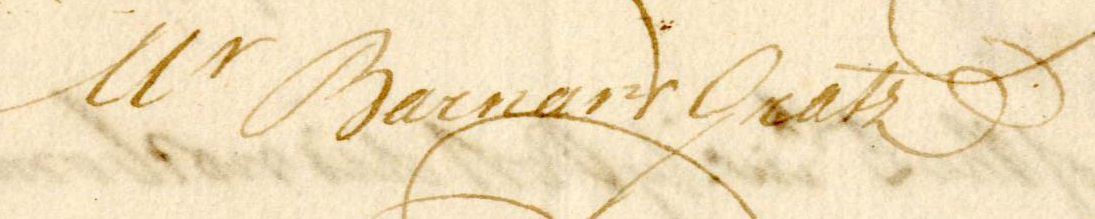M^r Barnard Gratz
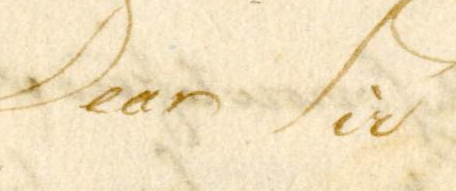Dear Sir
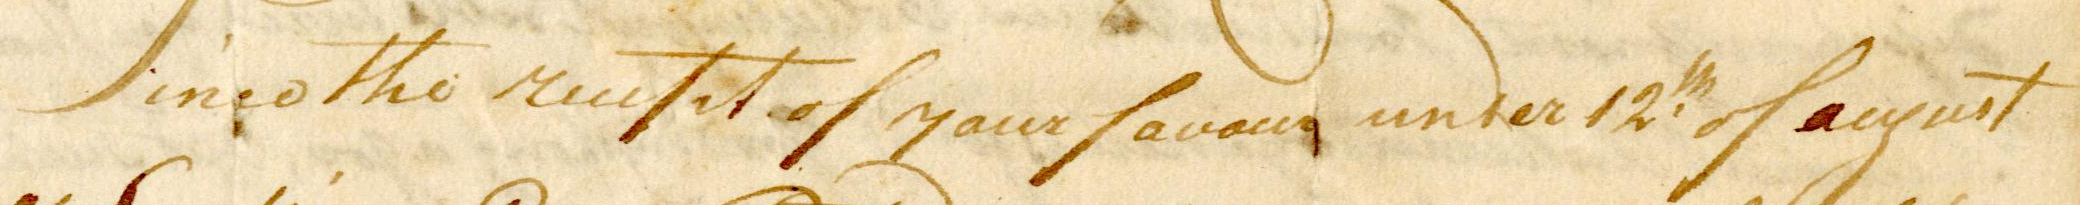Since the recipt of your favour under 12^th. of august
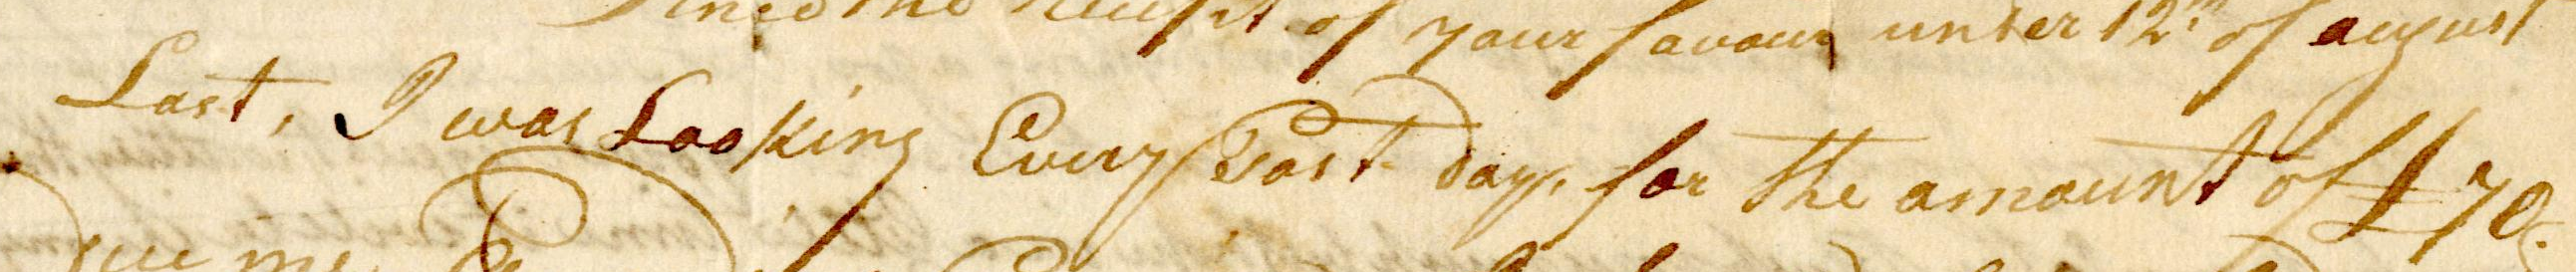Last, I was Looking Every Past day for the amount of £70
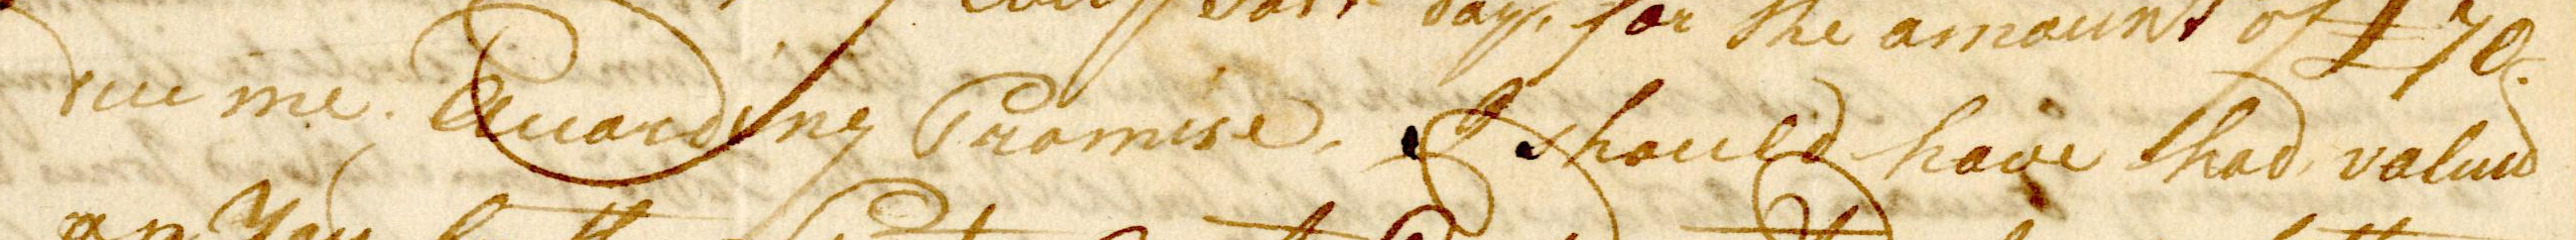rece me. Awarding Promise. I should have had valued
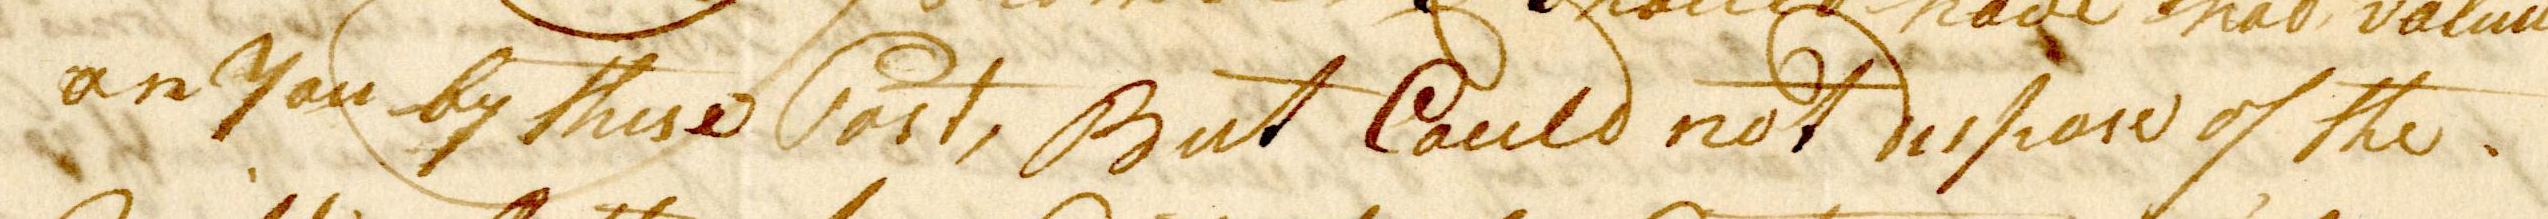on you by these Past, But Could not dispose of the
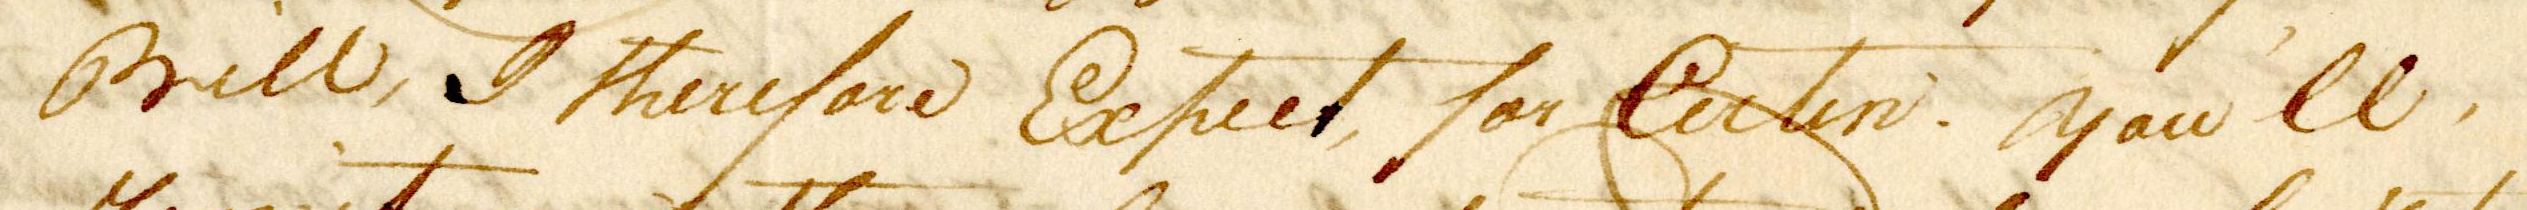Bill, I therefore Expect, for Certin. you ll.
